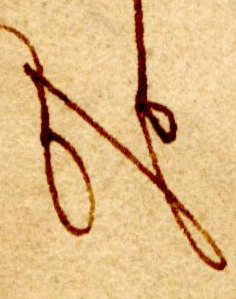To
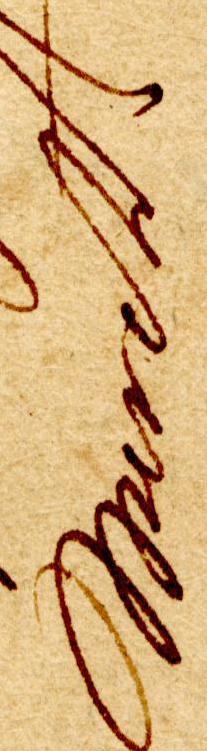Merch^t
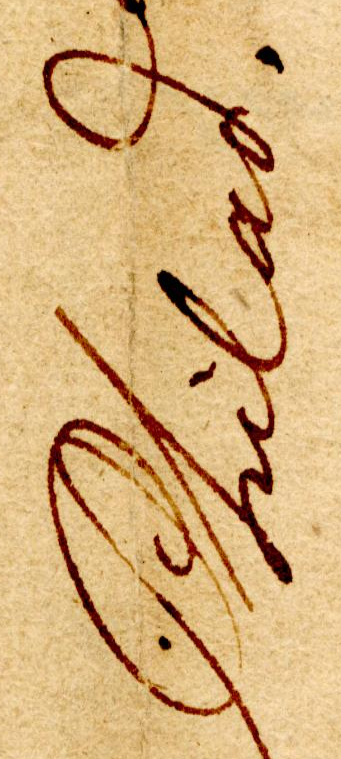Philad^a
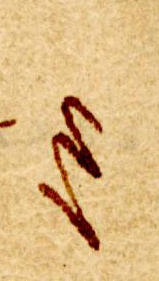in
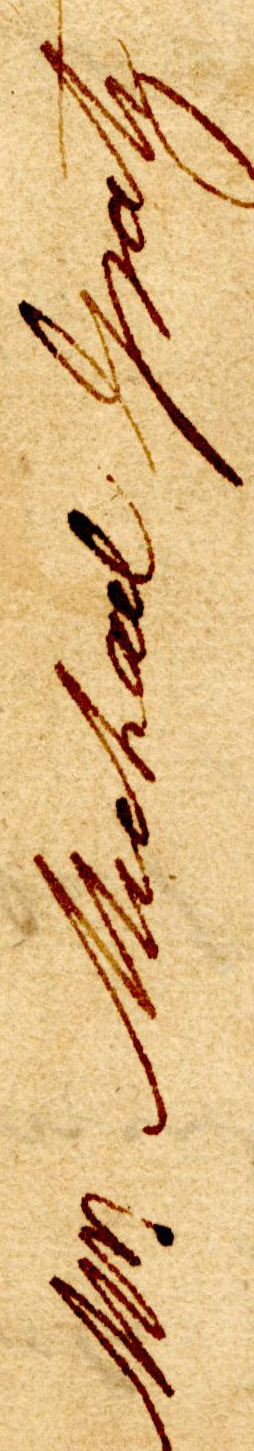M^r. Michael Gratz
